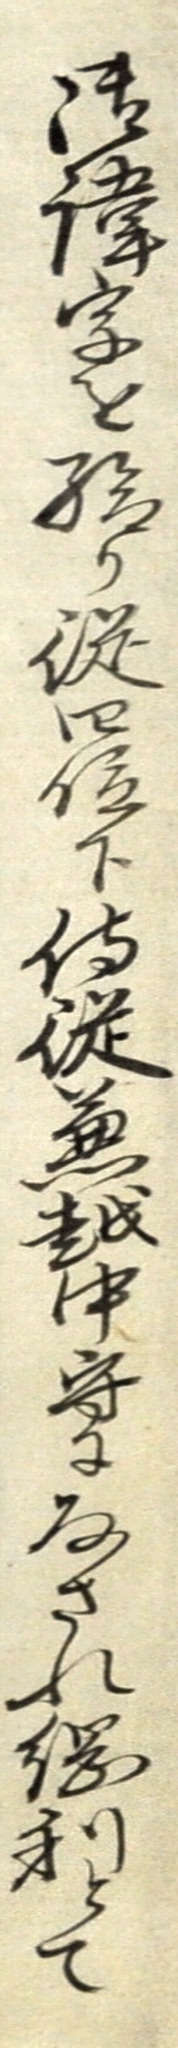御諱字を給り従四位下侍従兼越中守になされ綱利とて
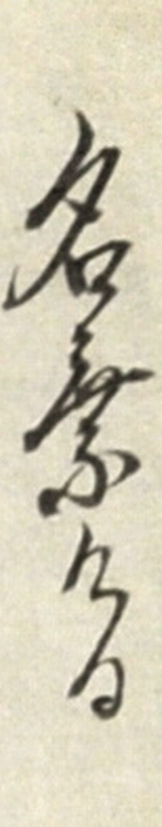名乗ける
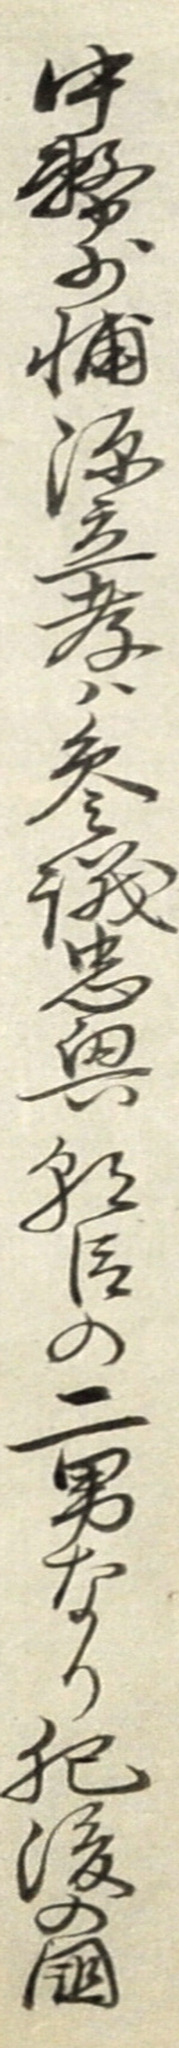中務少輔源立孝は参議忠興朝臣の二男なり肥後の国
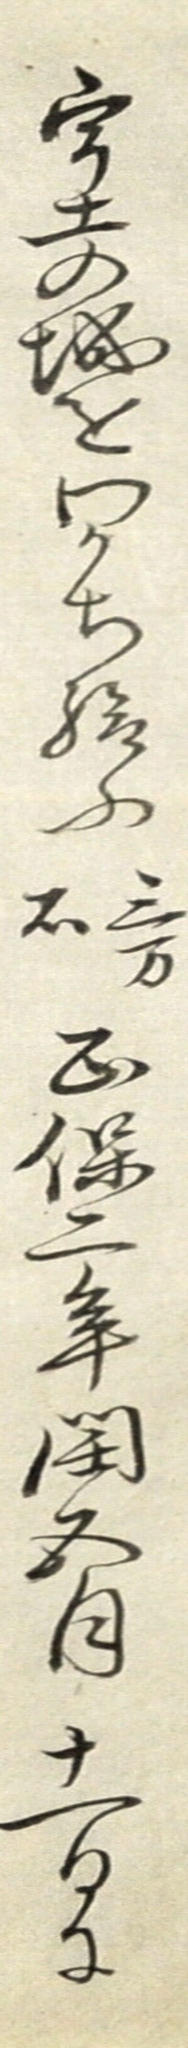宇土の城をわかち給ふ三万石正保二年閏五月十一日に
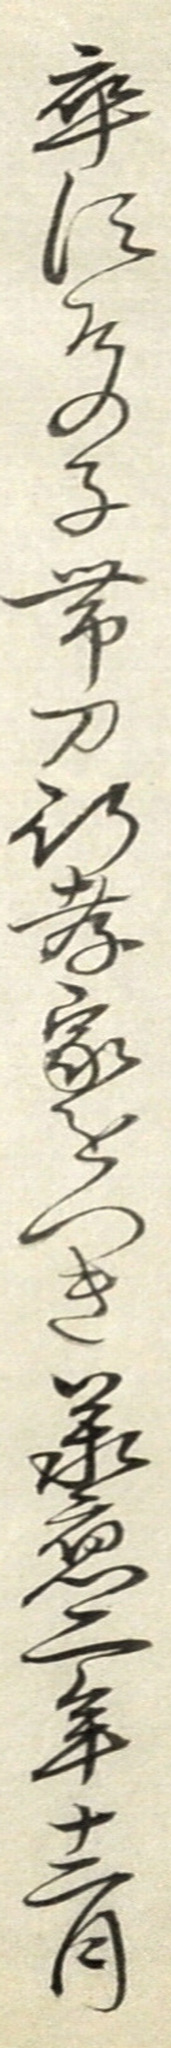卒すその子帯刀行孝家をつき承応二年十二月
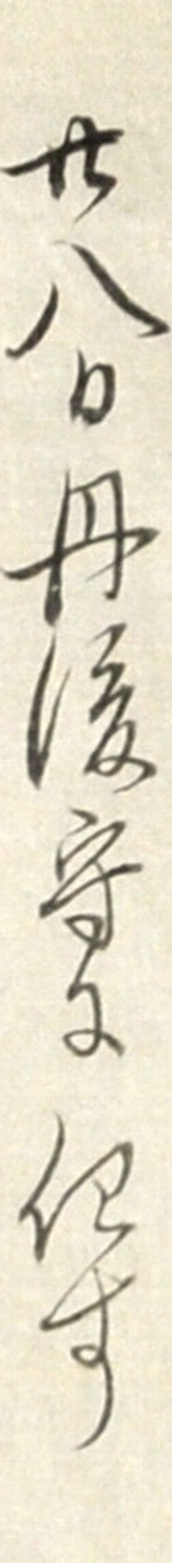廿八日丹後守に任す
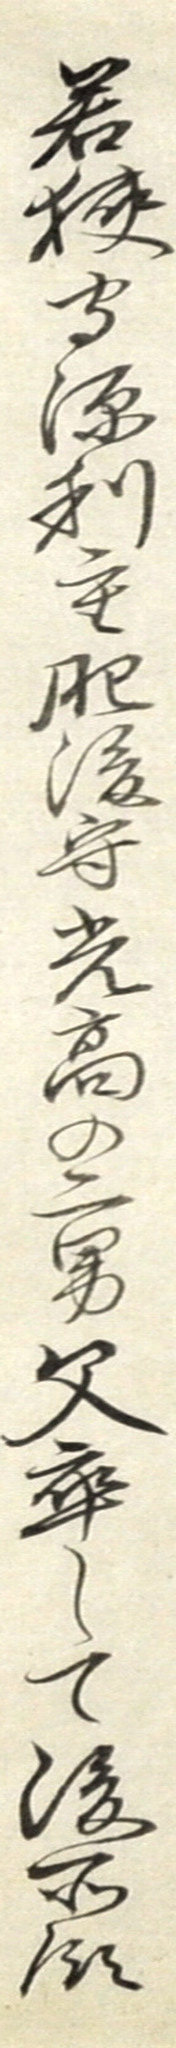若狭守源利重肥後守光高の二男父卒して後所領
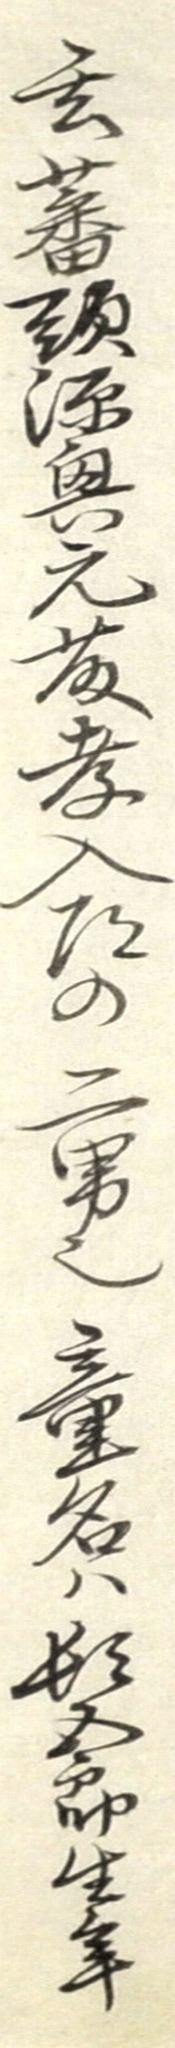玄蕃頭源興元藤孝入道の二男也童名は頓五郎生年
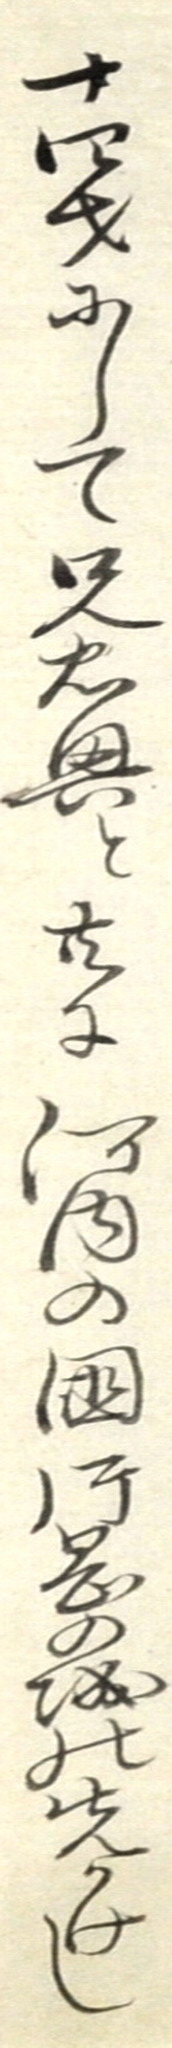十四才にして兄忠興と共に河内の国片岡の城の先かけし
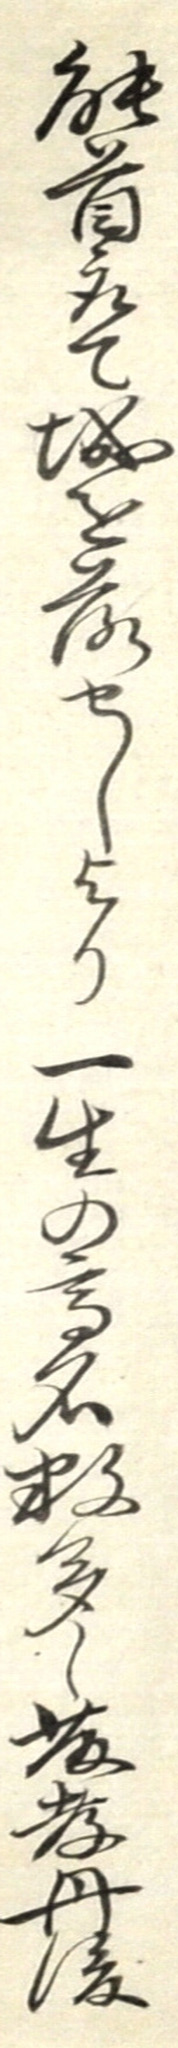能首取て城を落せしより一生の高名数多し藤孝丹後
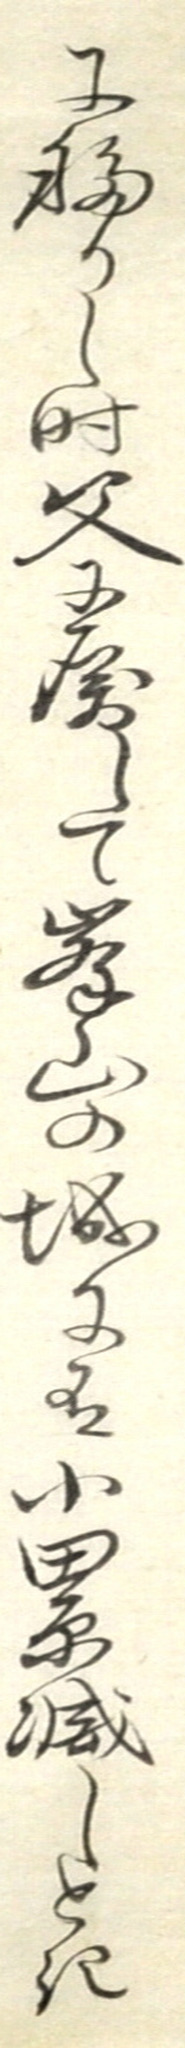に移りし時父に属して峯山の城に有小田原滅しとき
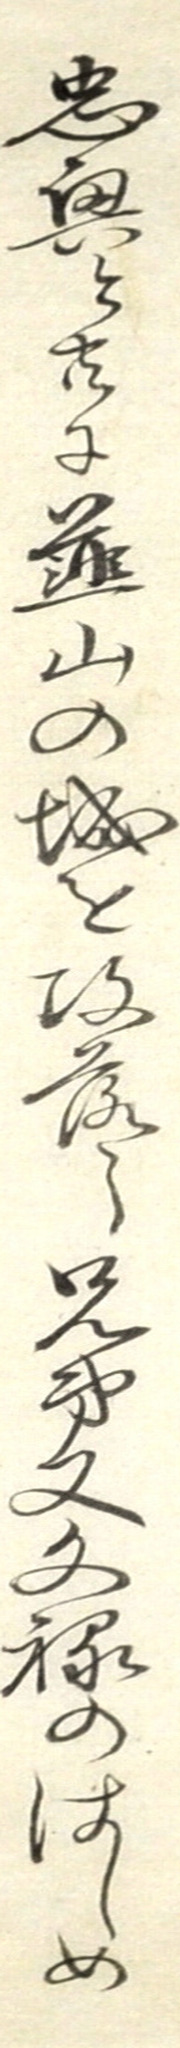忠興と共に韮山の城を攻落し兄弟又文禄のはしめ
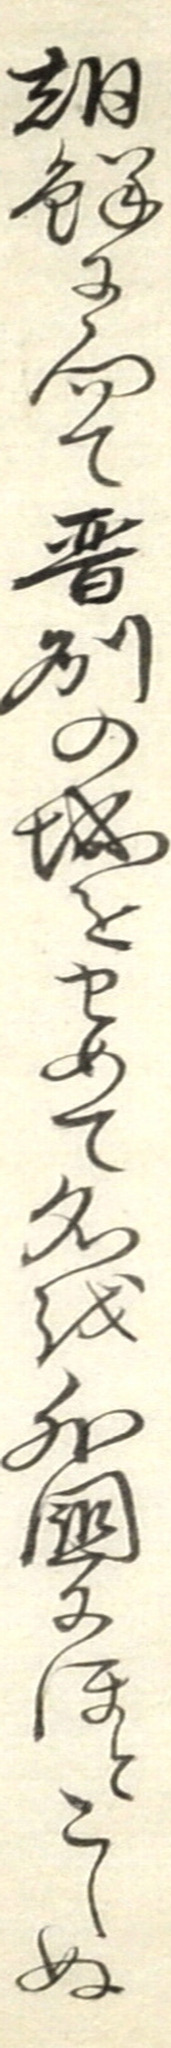朝鮮に向て晋州の城をせめて名を外国にほとこしぬ
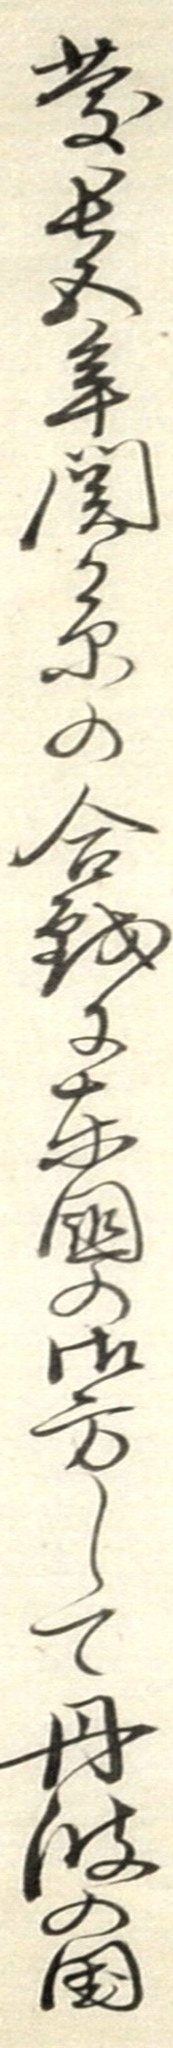慶長五年関ゕ原の合戦に東国の御方して丹波の国
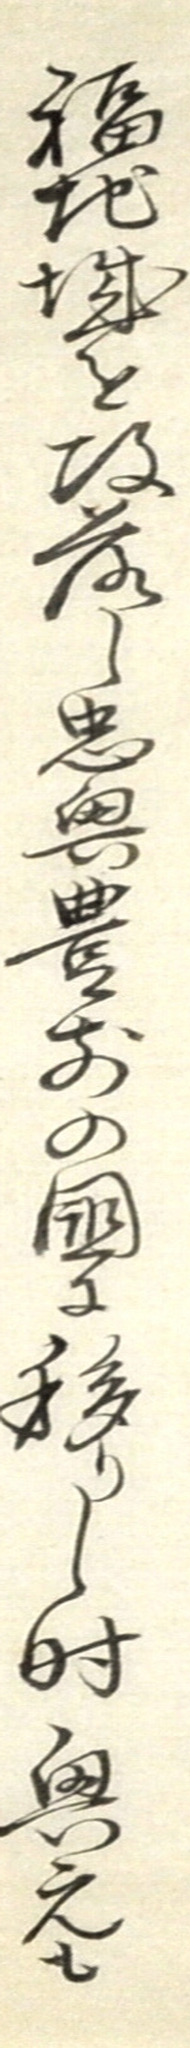福地城を攻落し忠興豊前の国に移りし時興元も
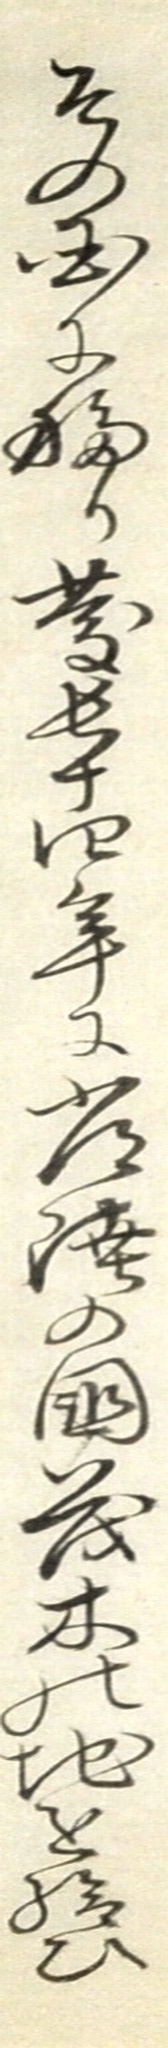その国に移り慶長十四年に常陸の国茂木の地を給ひ
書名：藩翰譜（七・下）
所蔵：伊那市立高遠町図書館・合同会社AMANE
